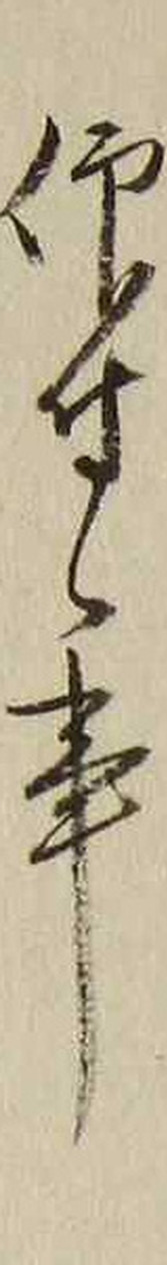仰付候事
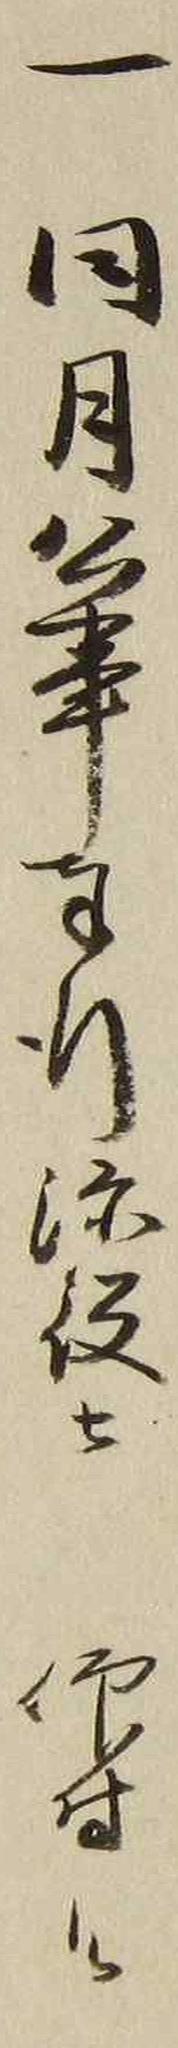一同月公事奉行添役被仰付候

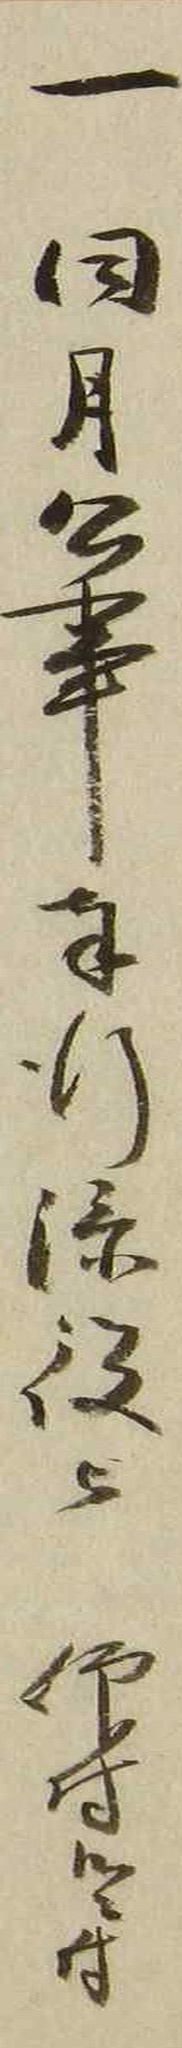一同月公事奉行添役被仰付候ニ付
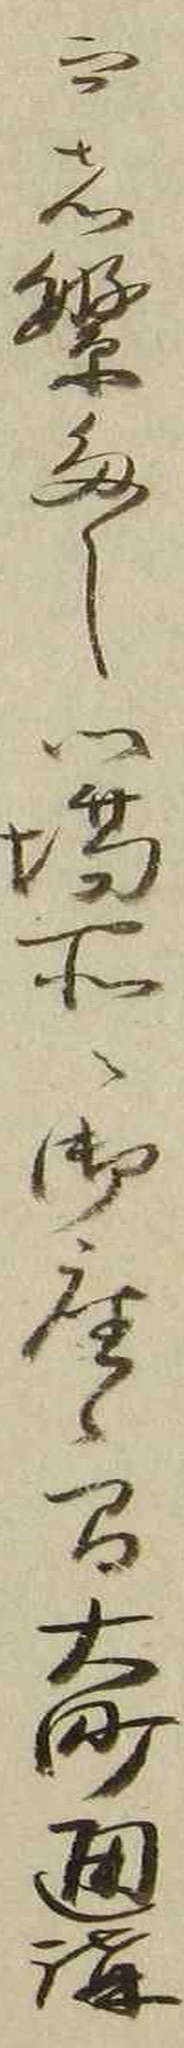而者繁多之御場所へ御座候間大町通講
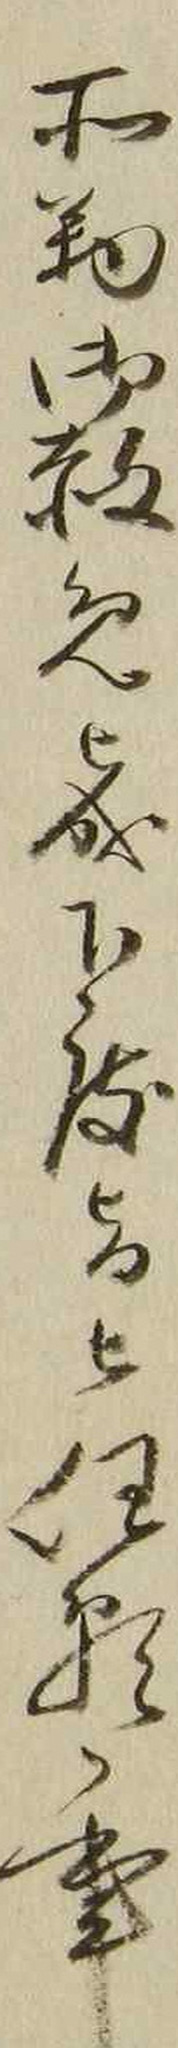所勤御赦免被成下度旨被任願候事
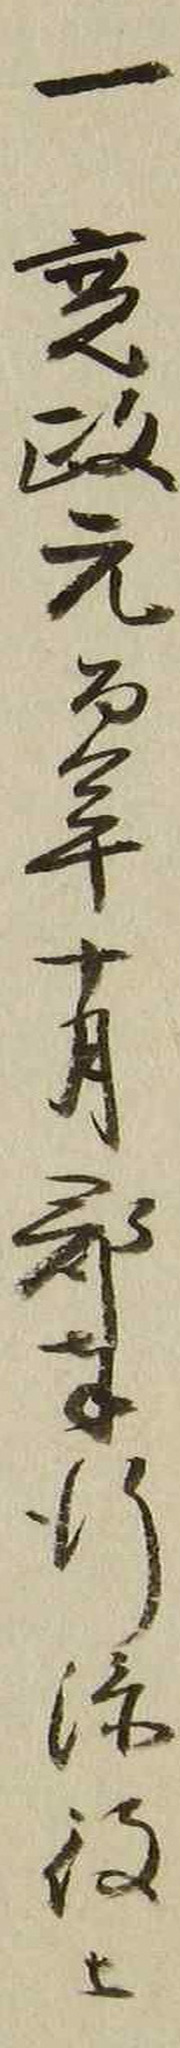一寛政元酉年十月郡奉行添役被
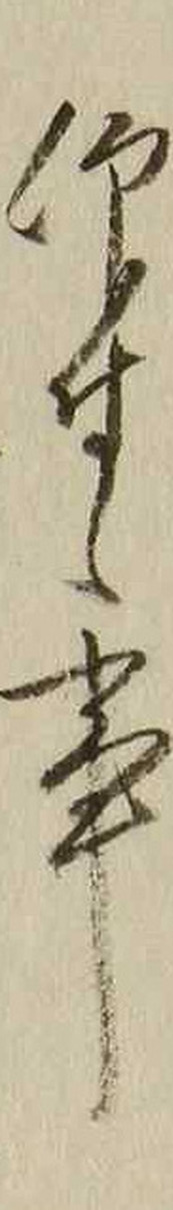仰付候事
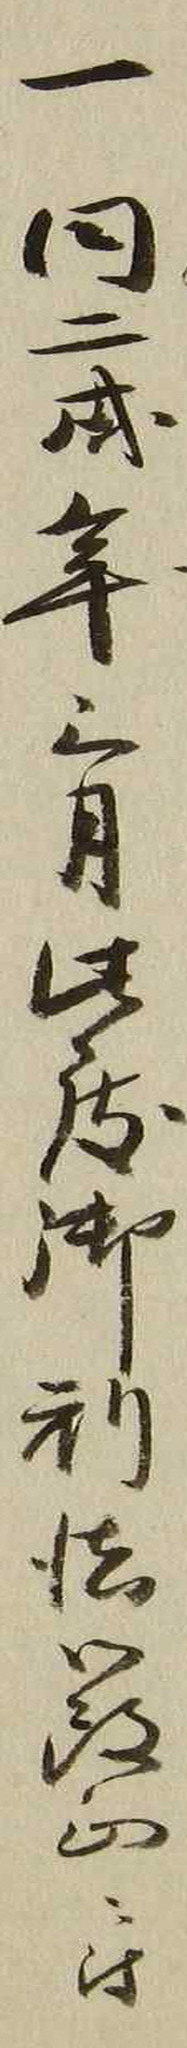一同二戌年三月此度御利法御改正ニ付
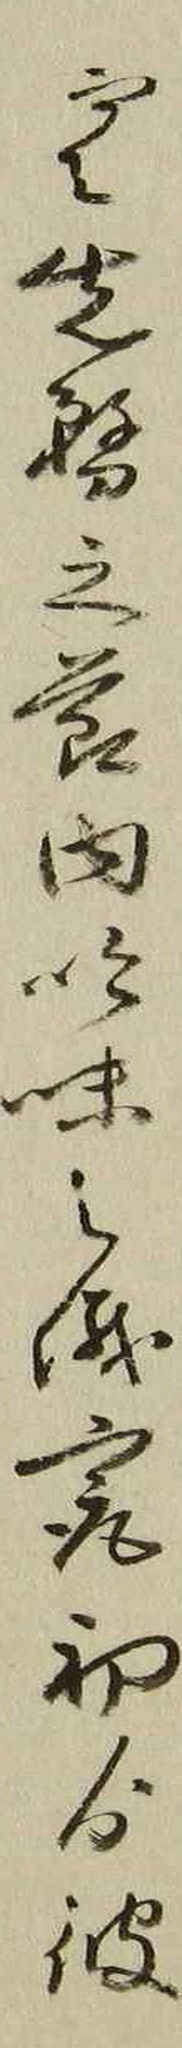而者先務之節内吟味之儀最初ゟ彼
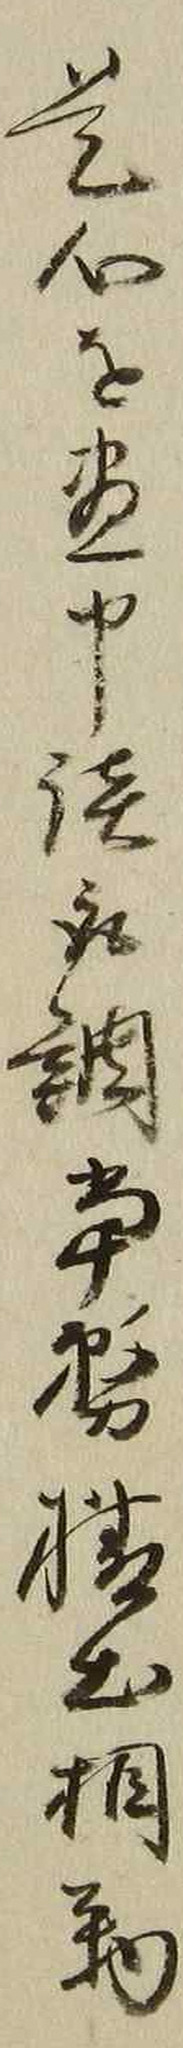是心を尽申諸取調当務精出相勤
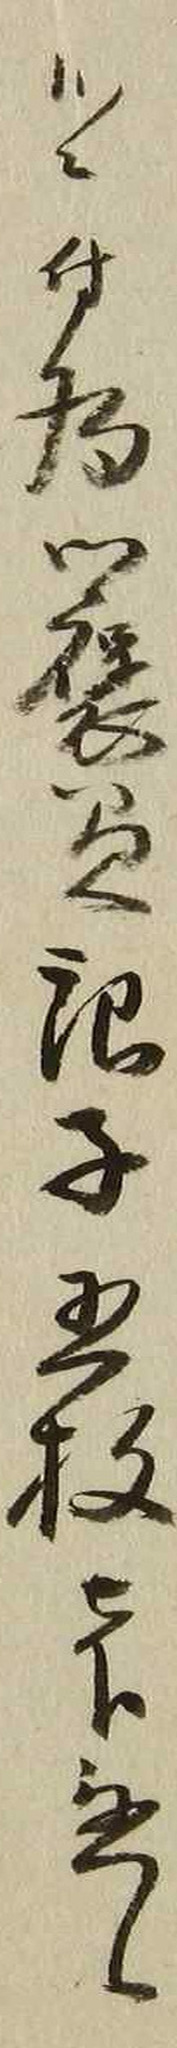候ニ付為御褒美銀子五枚被下置候
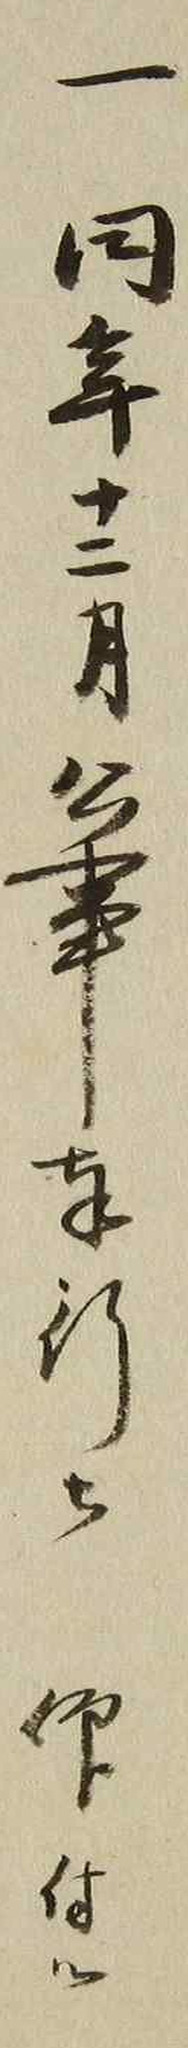一同年十二月公事奉行被仰付候
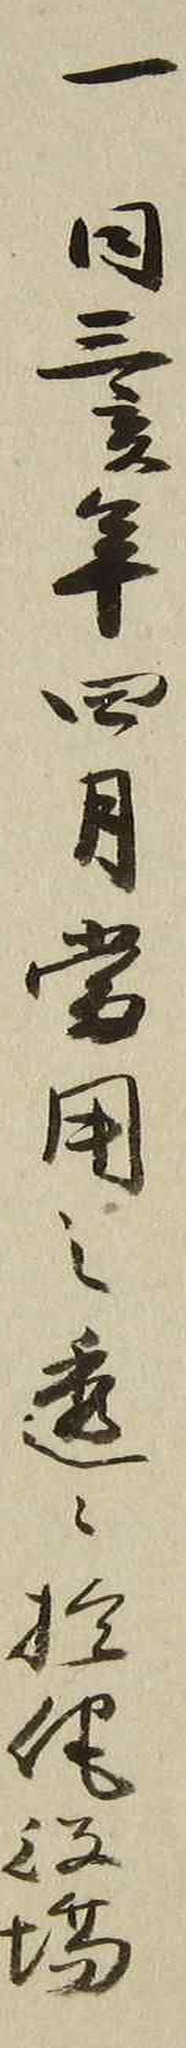一同三亥年四月当用之透ニ於他役場
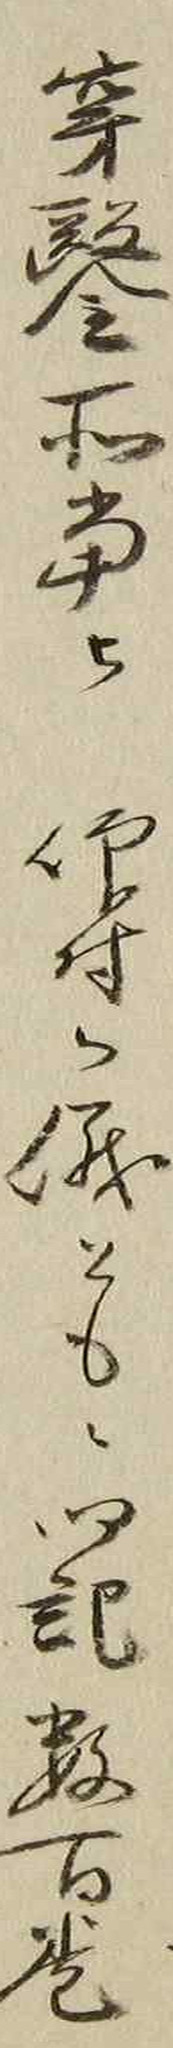穿鑿所当被仰付候儀ともニ御記数百巻
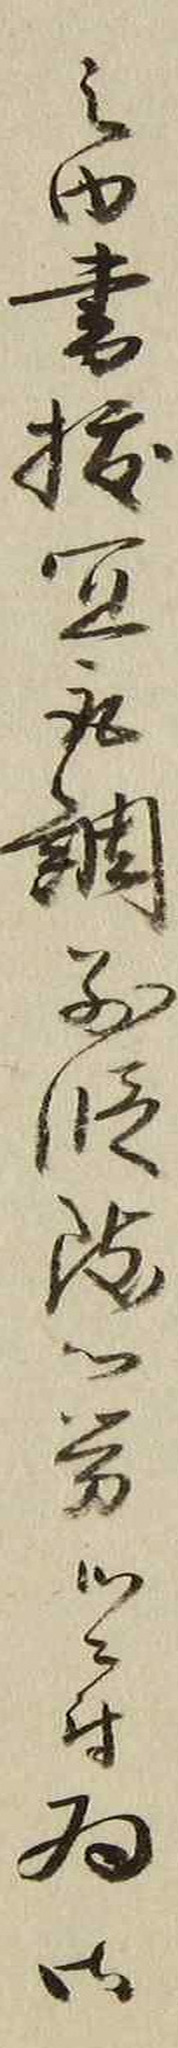之由書抜宜取調別段致御労候ニ付為御
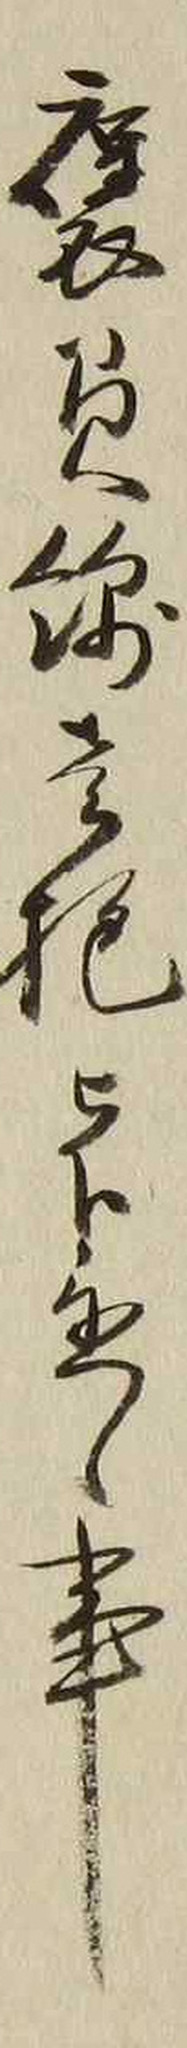褒美綿壱把被下置候事
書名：諸士系譜　巻之261　あ之部14
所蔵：会津若松市立会津図書館
